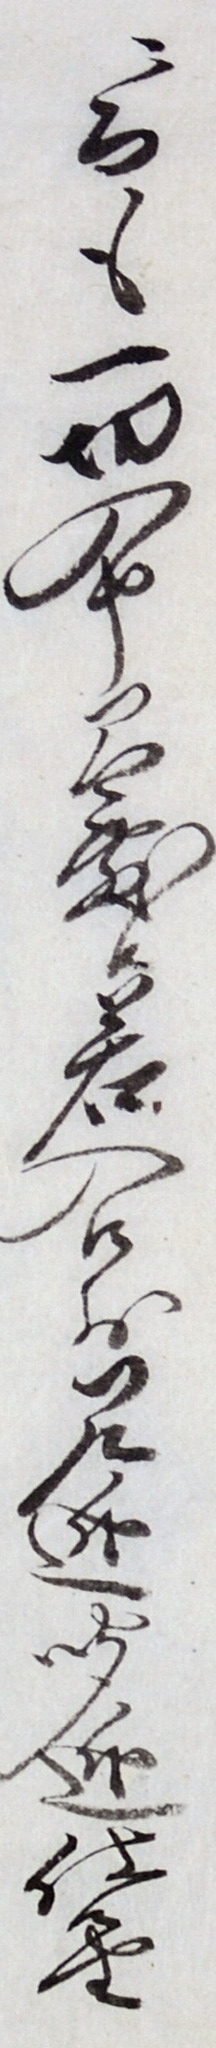ニ而も一切入申間敷候若入候於見逃聞逃仕候由
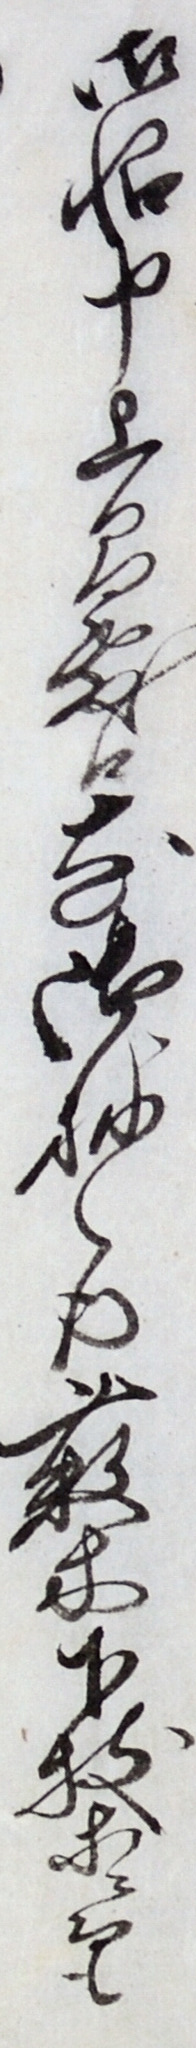御恨申上間敷候尤御林之内薮木下枝等ニ而も
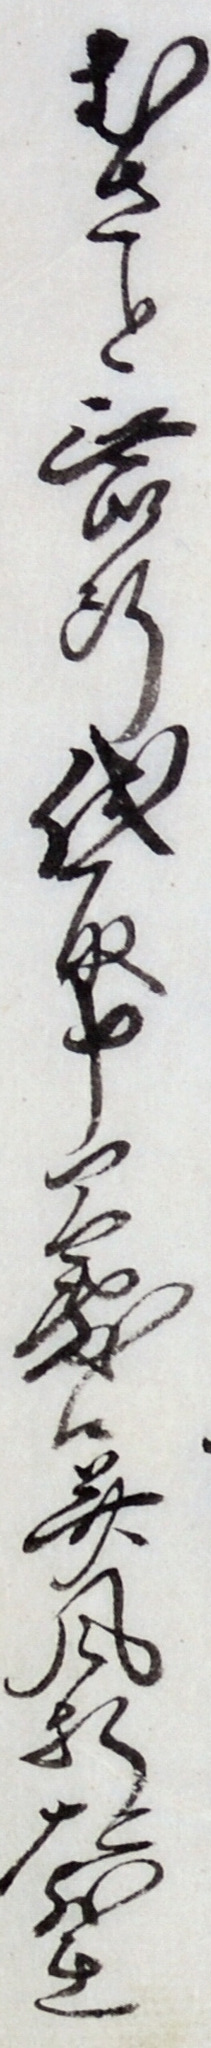むさと無御断伐取申間敷候并風折たおれ

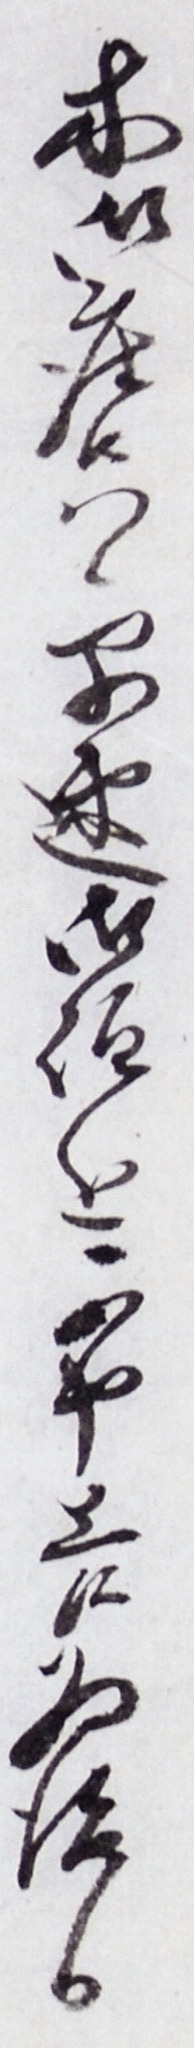木御座候ハヽ早速御注進可申上候為後日
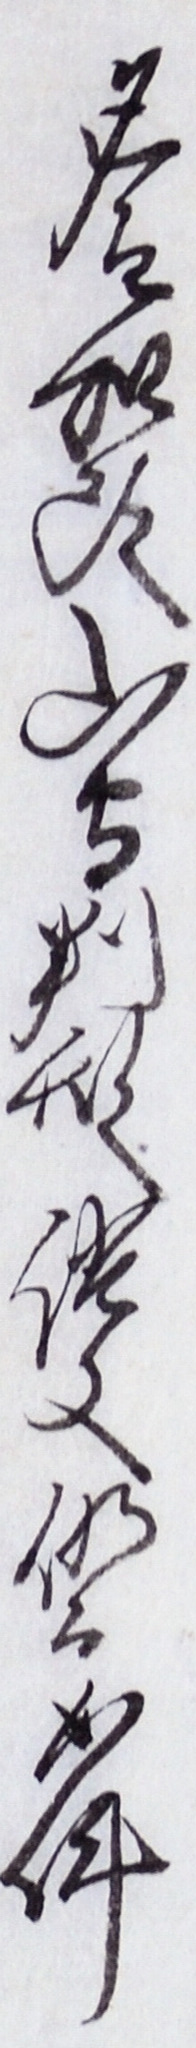名主組頭山守判形証文仍而如件
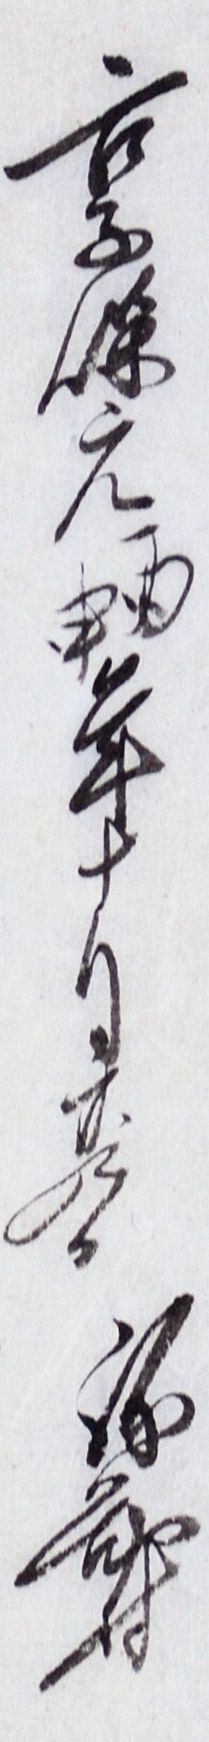享保元丙申年十月廿九日弥勒村
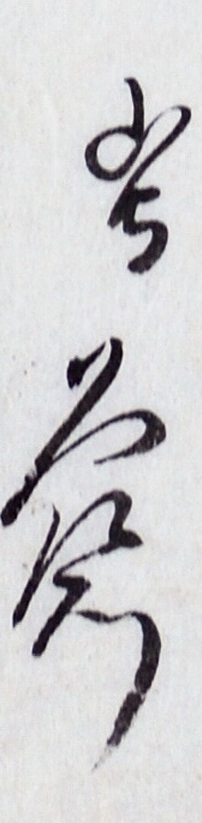山守久左衛門
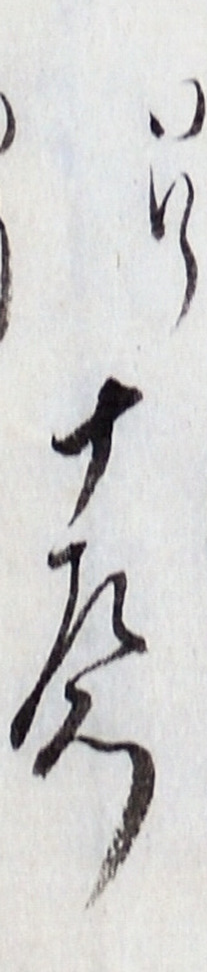同断十左衛門
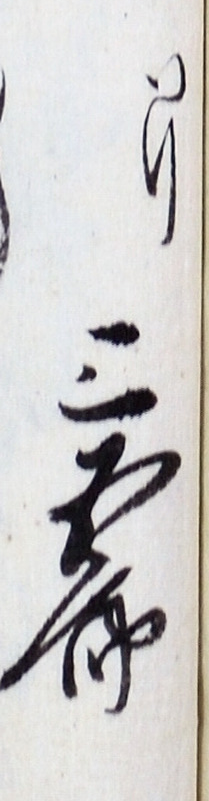同断三五郎
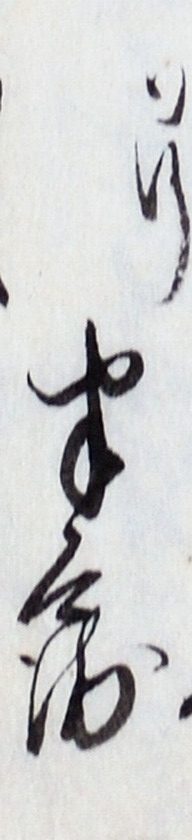同断半兵衛
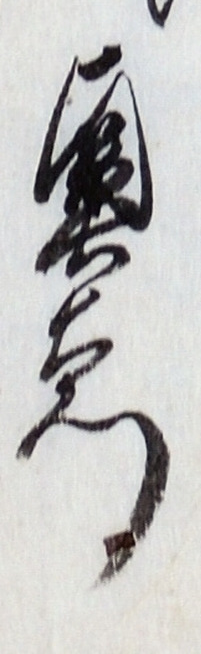同断伝右衛門
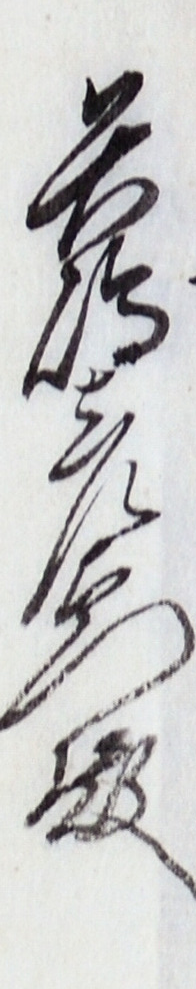矢嶋彦右衛門殿

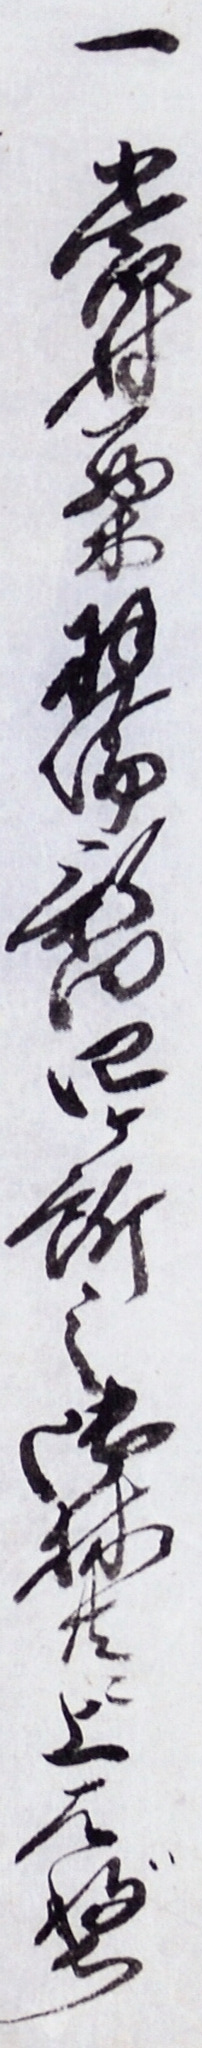一当村栗羽場新田四ヶ所之御林共ニ上ぶち
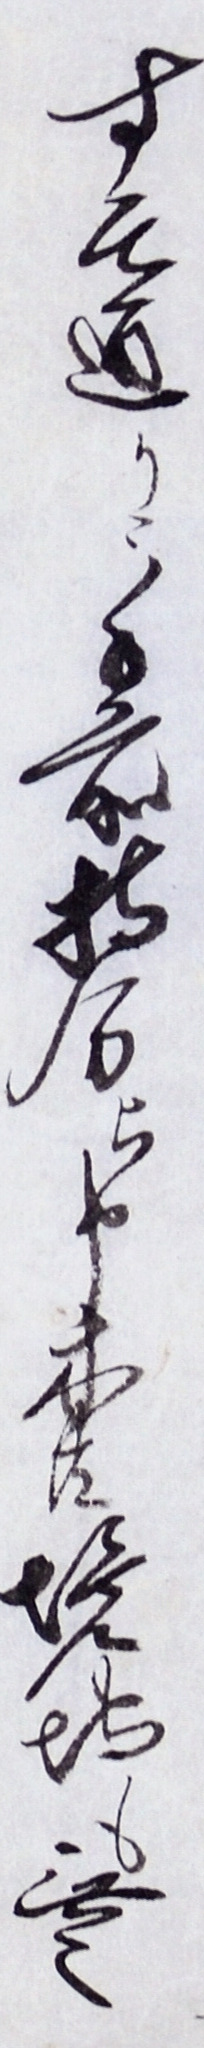すそ通りニ手前持分与申来候共境埒も無之
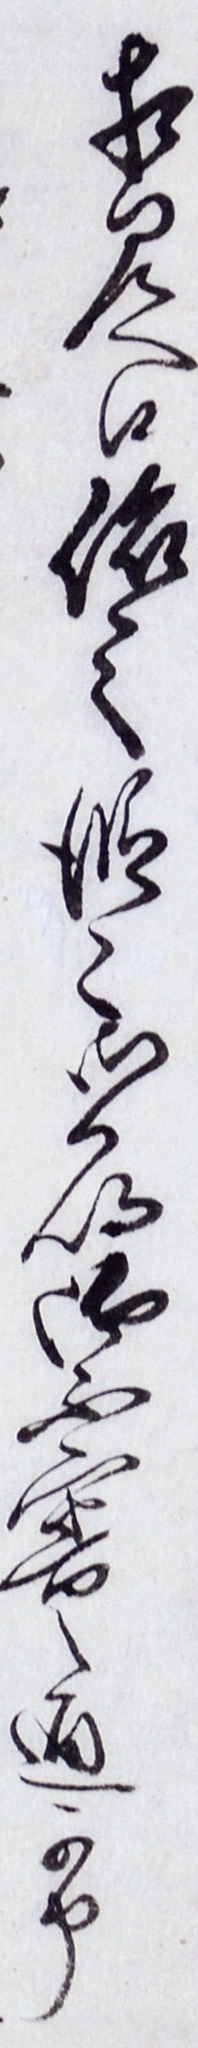相見へ候依之段々御尋御不審之通可申
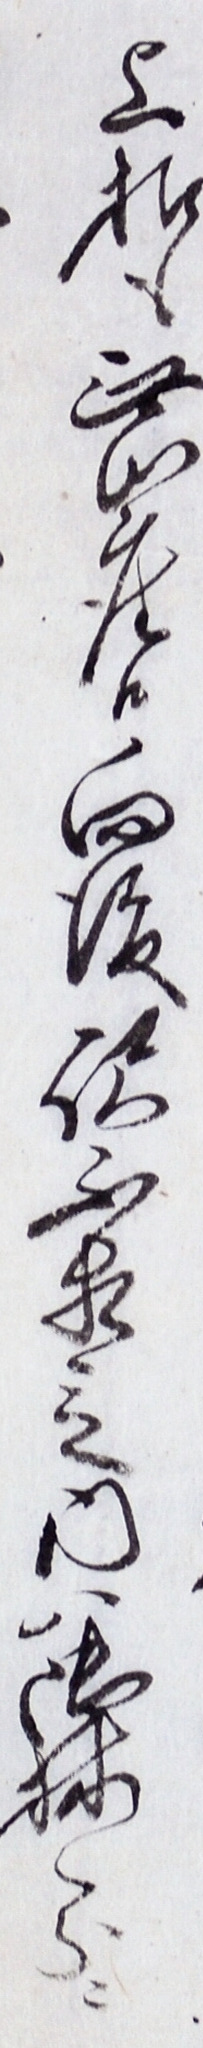上様も無御座候向後役不相定内ハ御林之分ニ
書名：御林御竹藪証文控
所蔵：伊那市立高遠町図書館・合同会社AMANE
